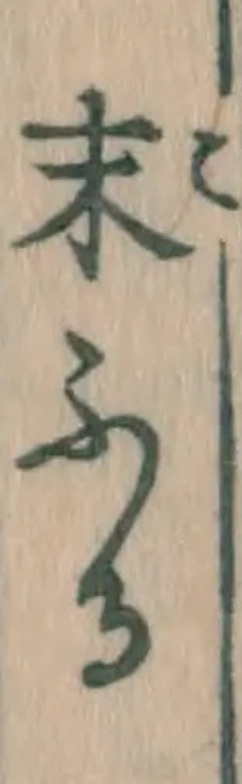末ふる
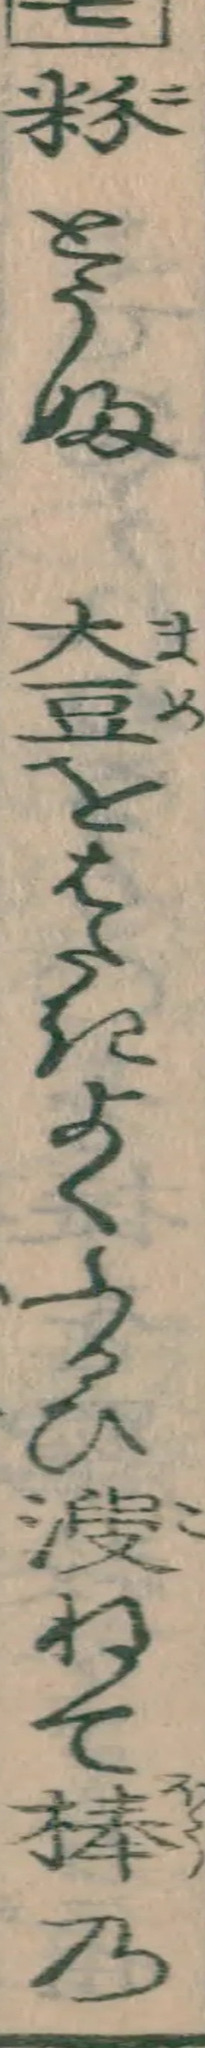廿七粉とうふ大豆をはたきよくふるひ溲ねて棒の
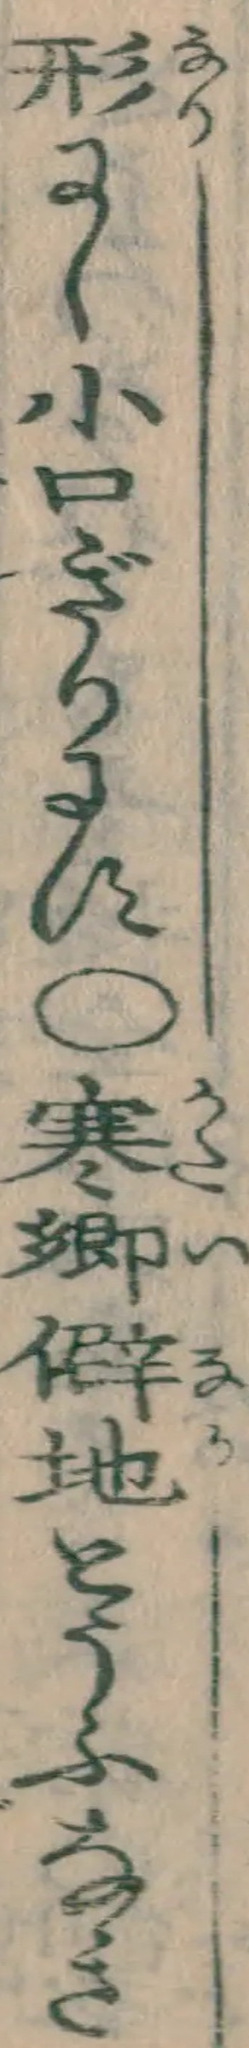形にし小口ぎりにす○寒郷僻地とうふなき
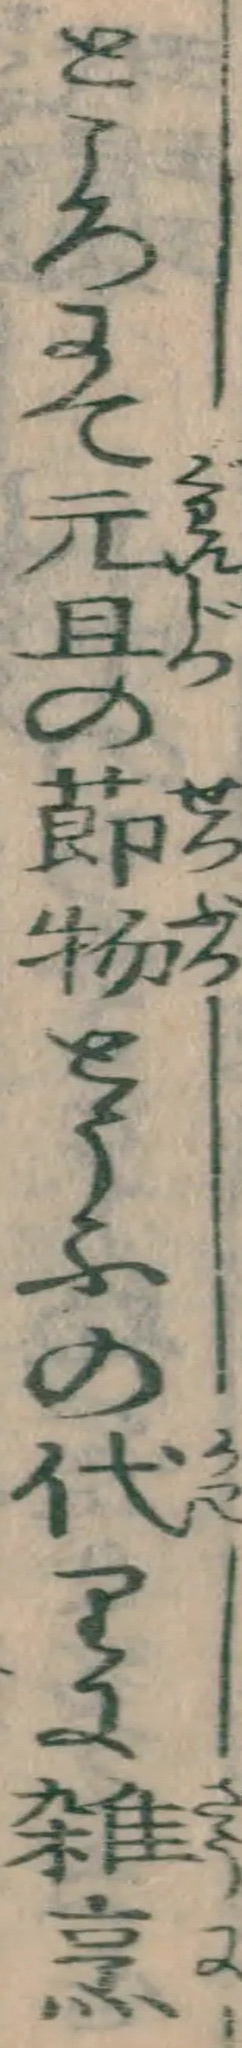ところにて元旦の節物とうふの代りに雑烹
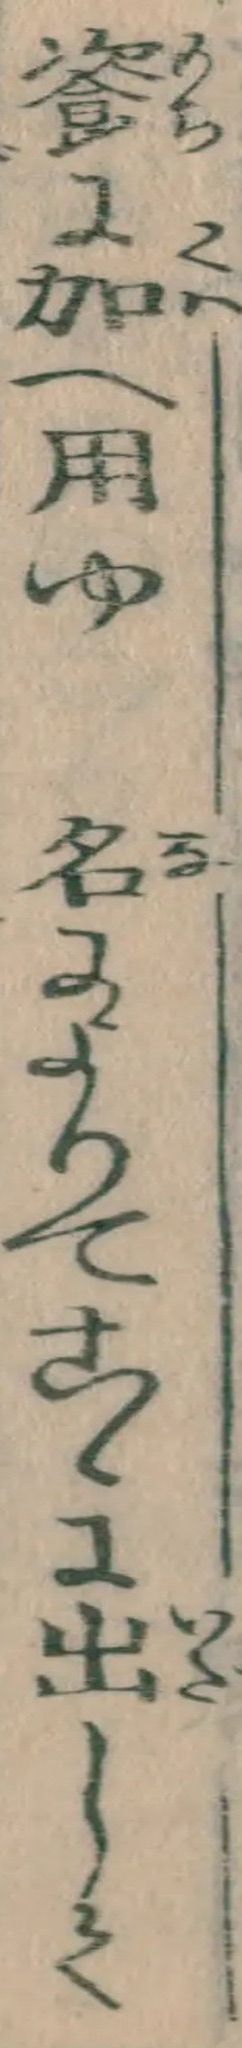餈に加へ用ゆ名によりてこゝに出して
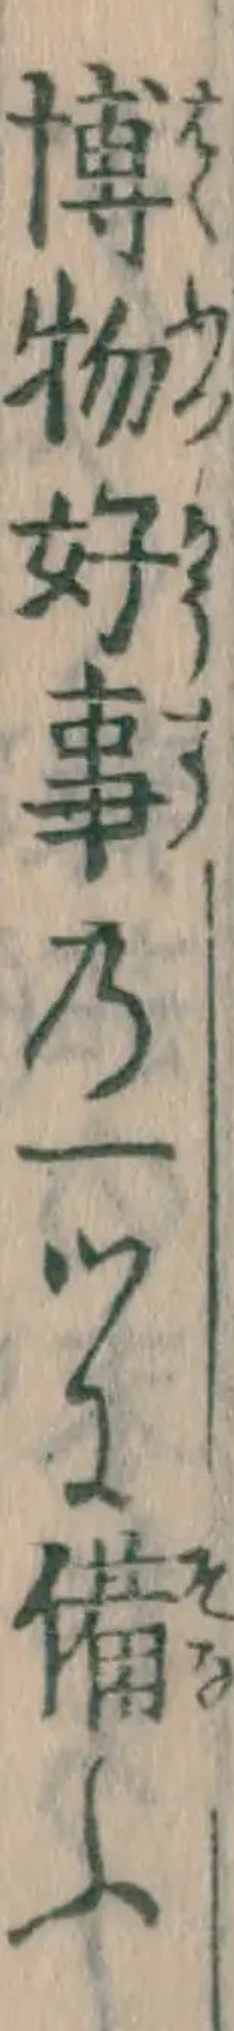博物好事の一つに備ふ
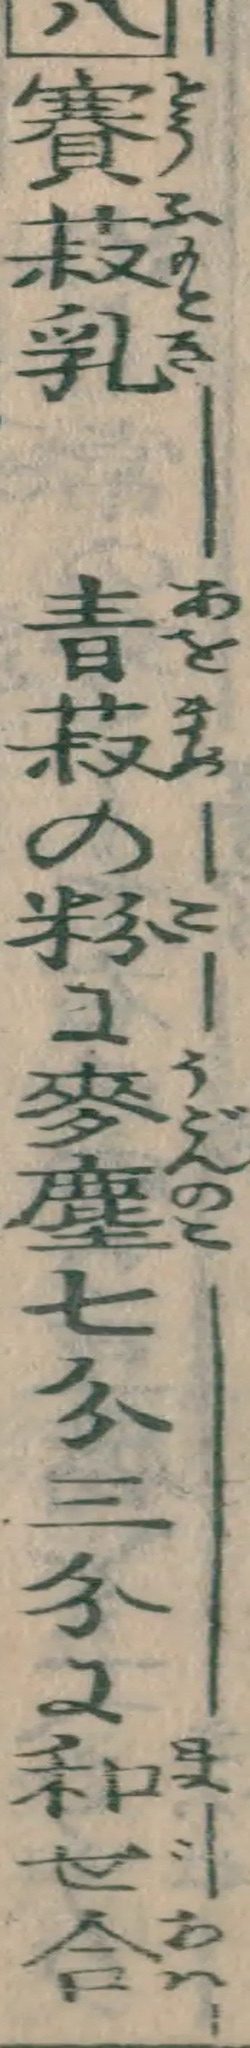廿八賽菽乳青菽の粉に麦塵七分三分に和ぜ合
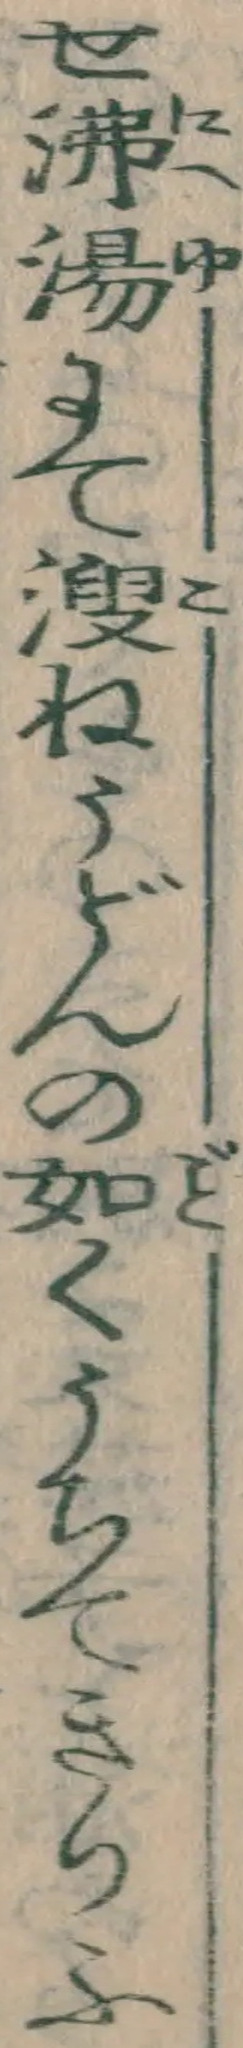せ沸湯にて溲ねうどんの如くうちてきりふ
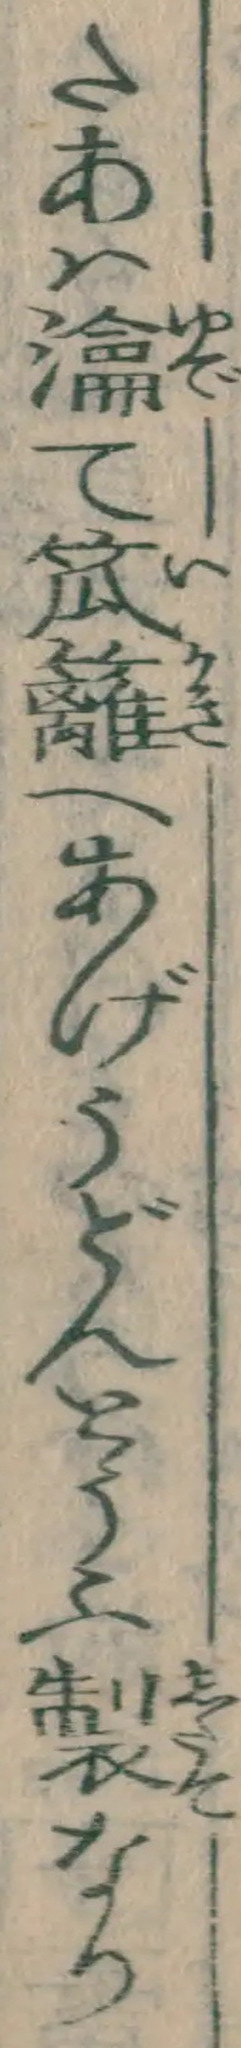たあは瀹て笊籬へあげうどんとうふ製なり

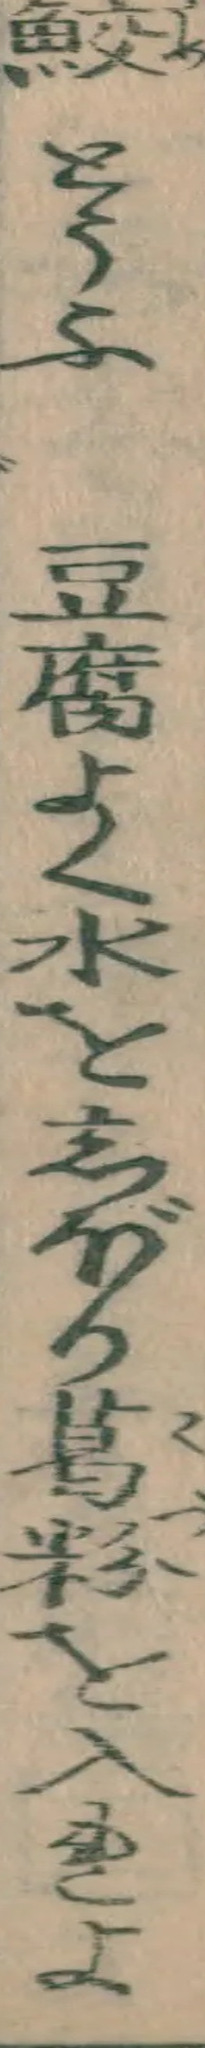廿九鮫とうふ豆腐よく水をしぼり葛粉を入れよ
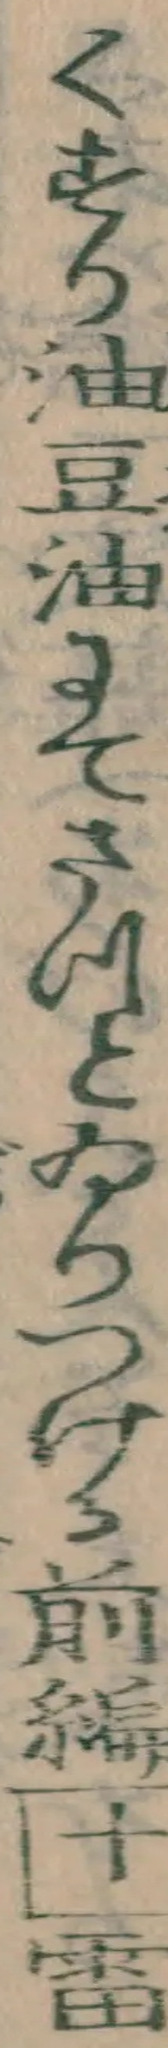くすり油豆油にてさつとゐりつける前編十雷
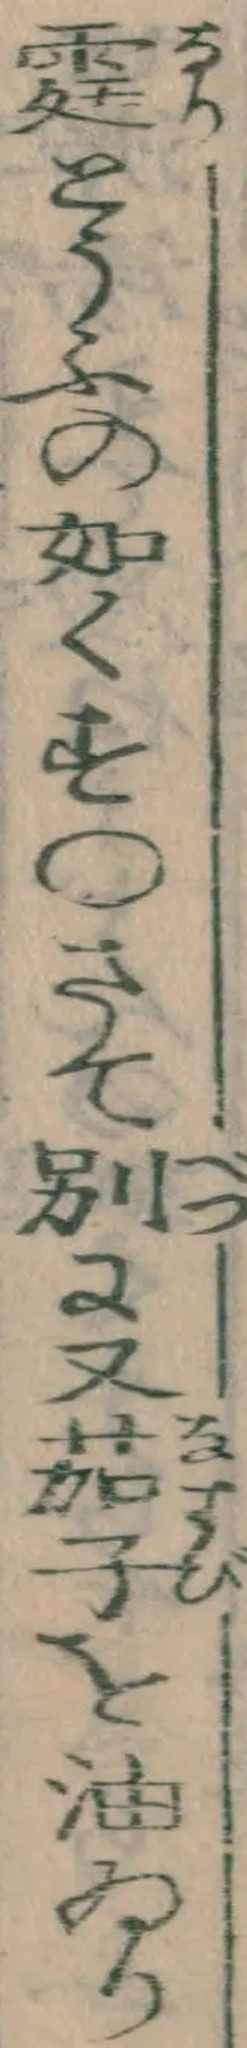霆とうふの如くす○さて別に又茄子を油ゐり
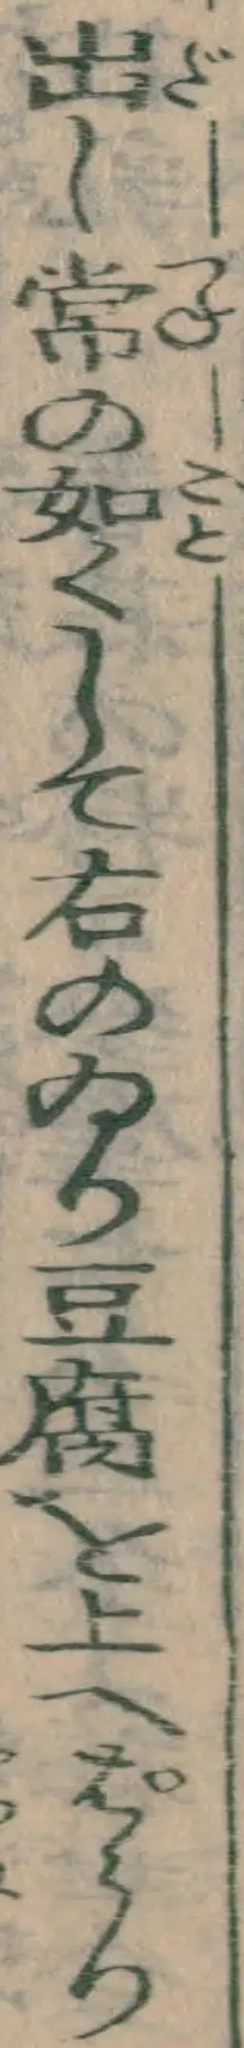出し常の如くして右のゐり豆腐を上へばらり
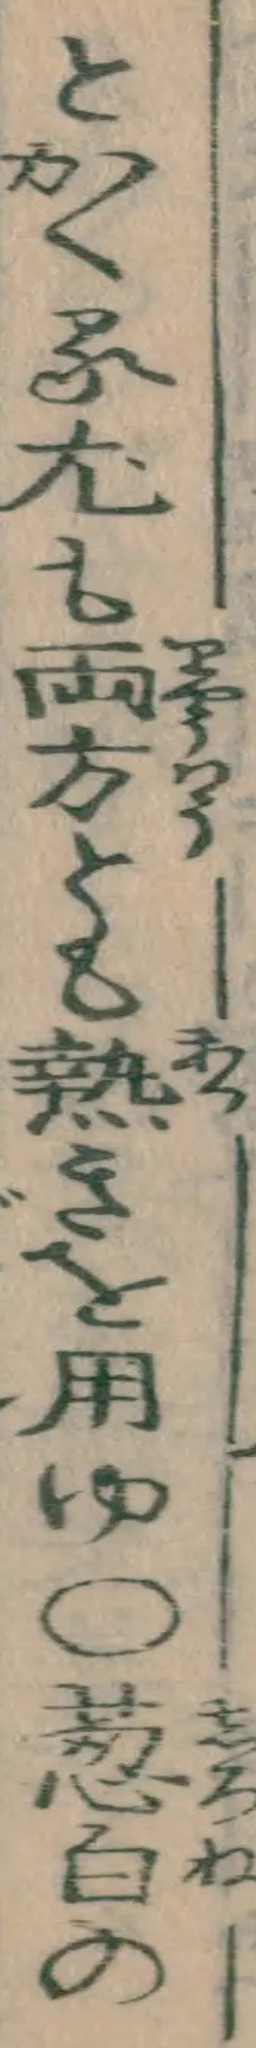とかくる尤も両方とも熱きを用ゆ○葱白の
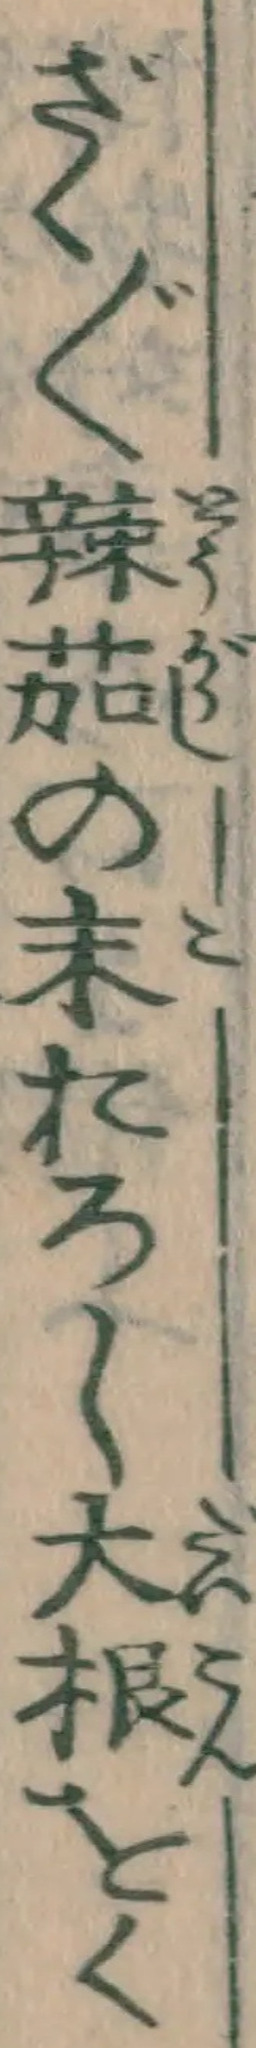ざく〳〵辣茄の末おろし大根をく
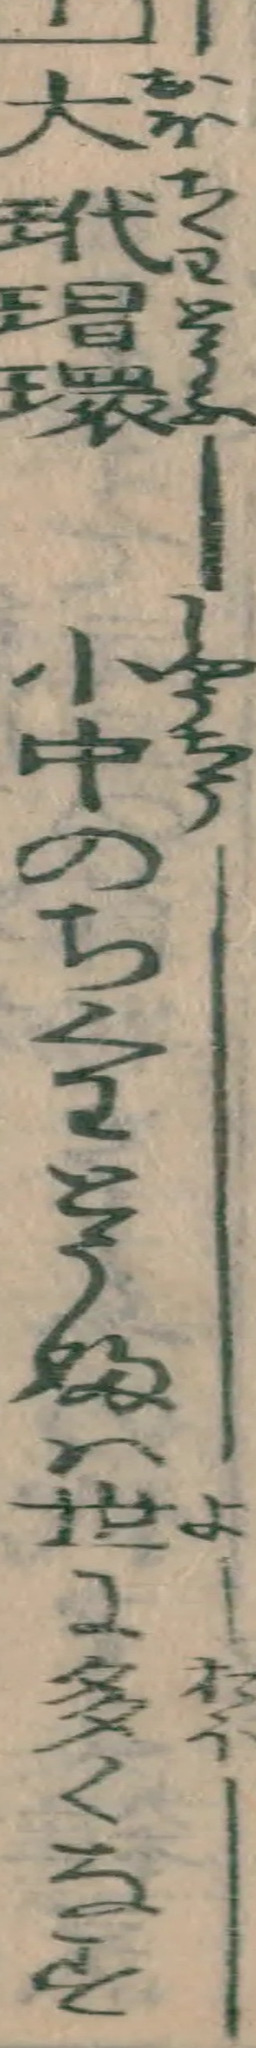三十大玳琩環小中のちくわとうふは世に多くなす
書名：豆腐百珍. 続編
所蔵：国立国会図書館 National Diet Library, JAPAN
